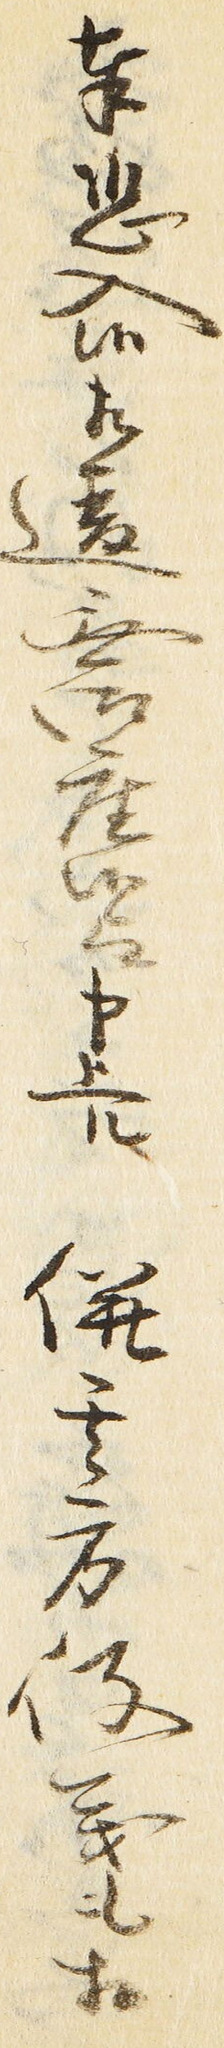奉恐入候相違無御座候と申上る併其方役義も相
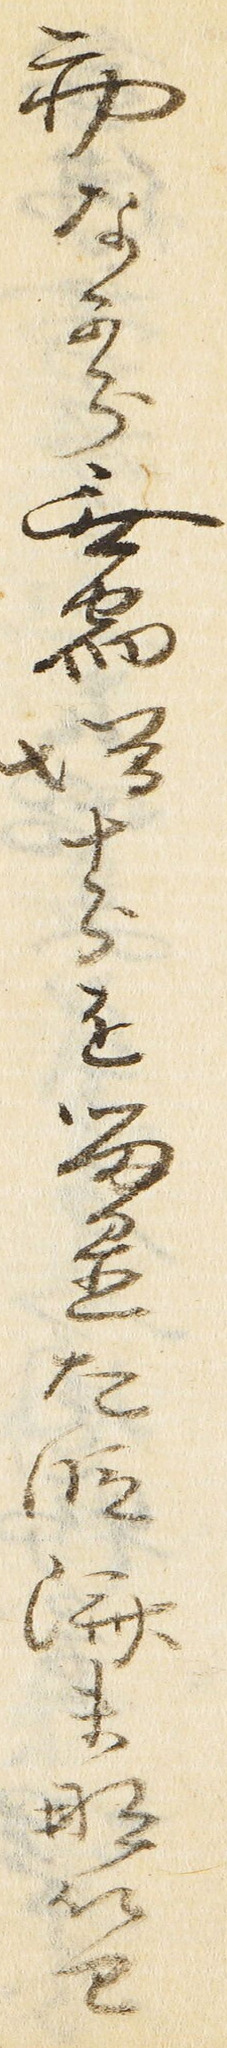勤なから無宿増十郎を留置た段済まないわ
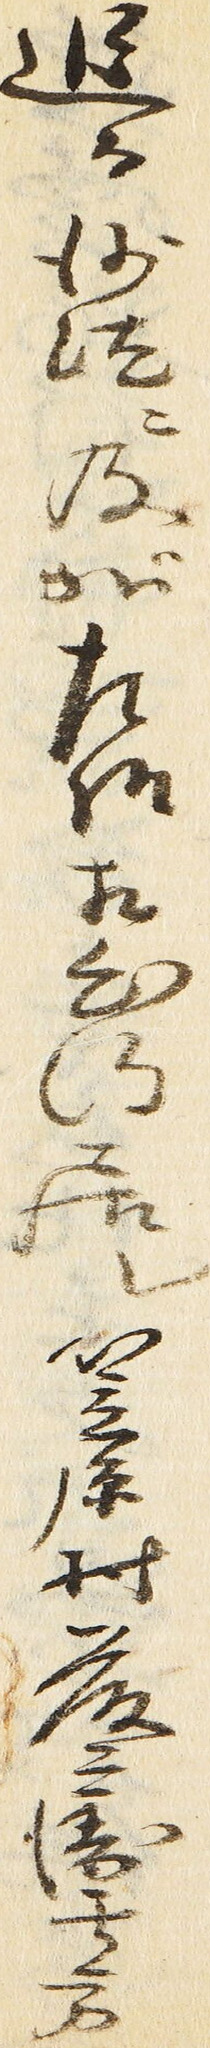追而沙汰に及が左様相心得居レ笠原村藤兵衛其方
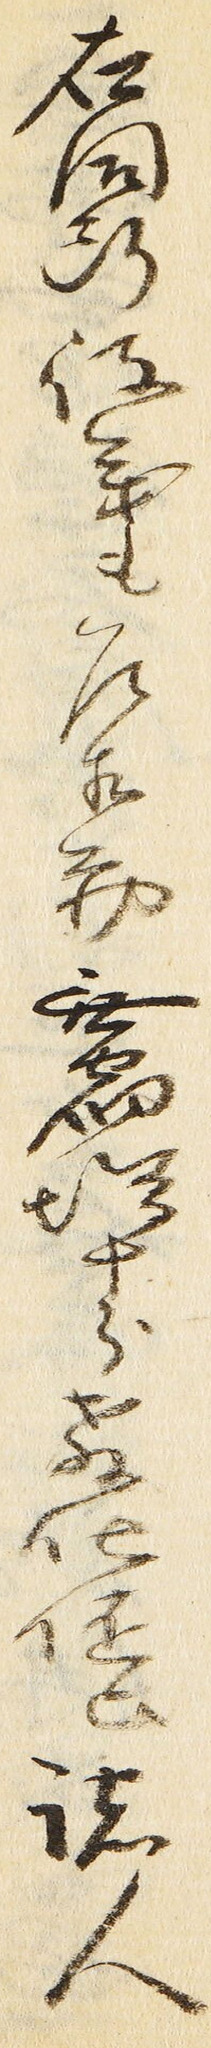右同断役義も乍相勤無宿増十郎教化随ひ諸人
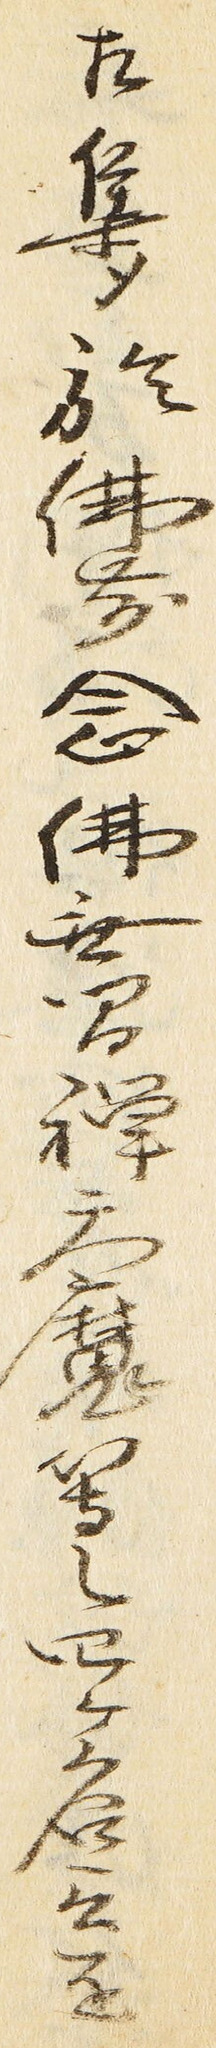相集め於仏前念佛無間禅天魔等之四ケ名言を
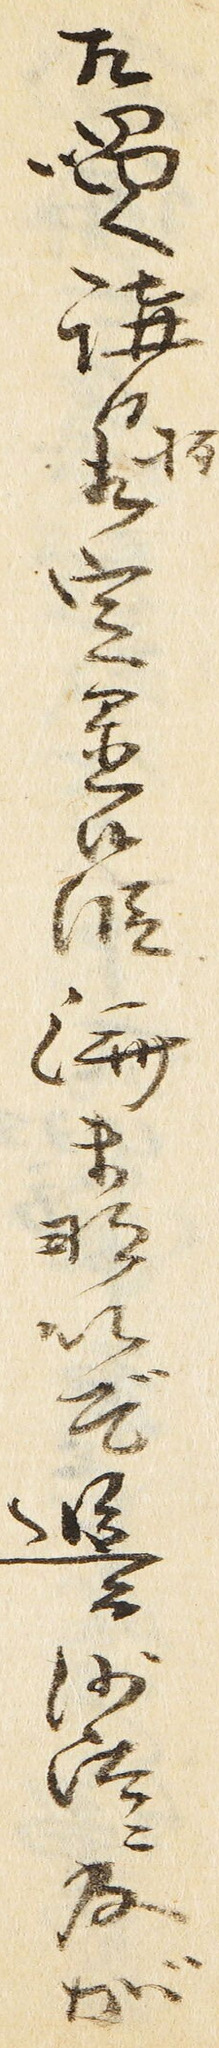相唱へ講日抔相定置候段済まないぞ追而沙汰に及が
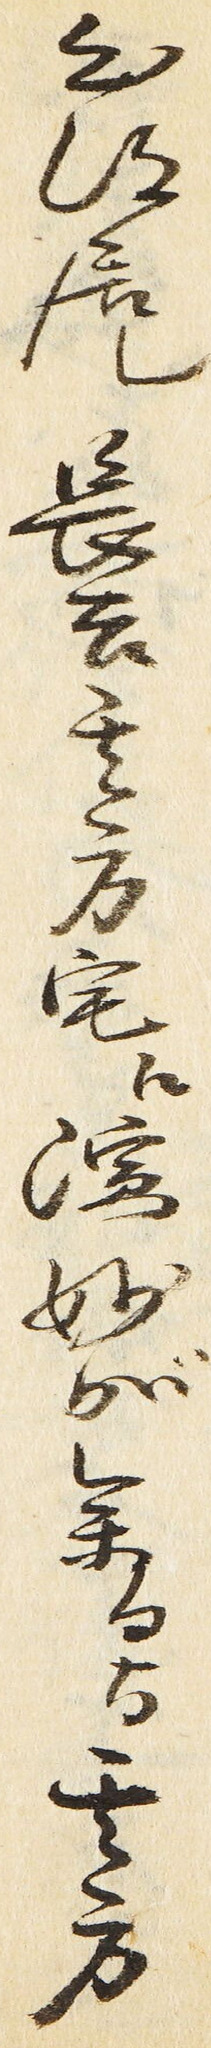心得居レ長吉其方宅江演妙が参ると其方
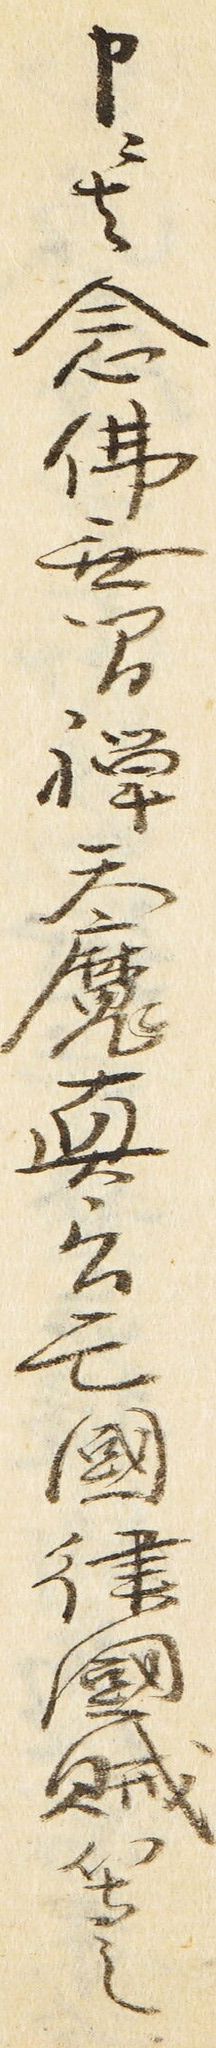申には念佛無間禅天魔真言亡国律国賊等之
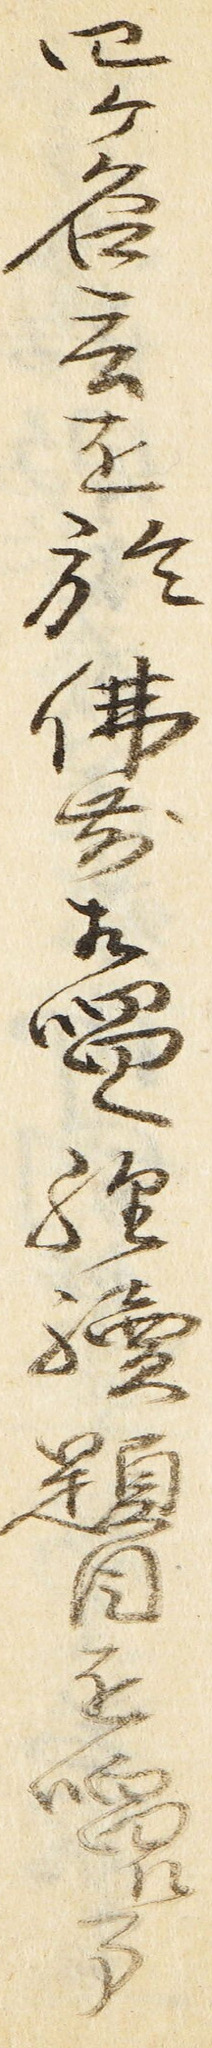四ケ名言を於仏前相唱へ経読題目を唱ル事
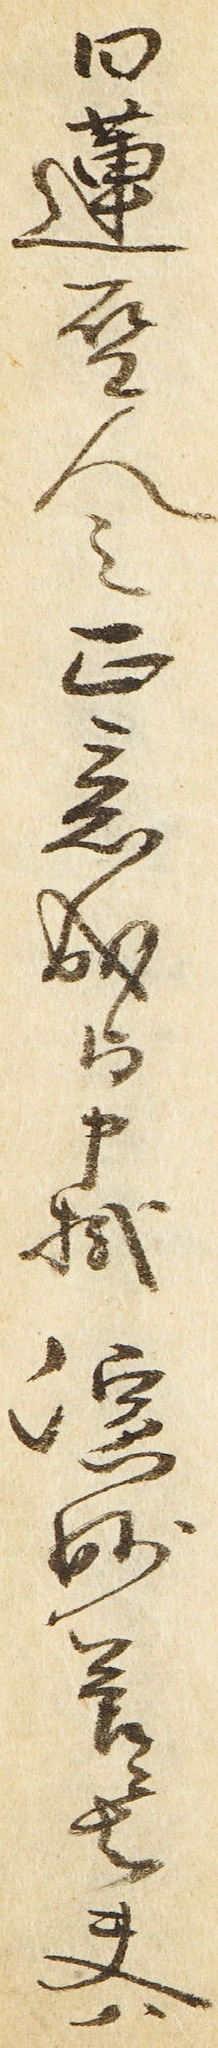日蓮聖人之正意成と申掛演妙答には夫は

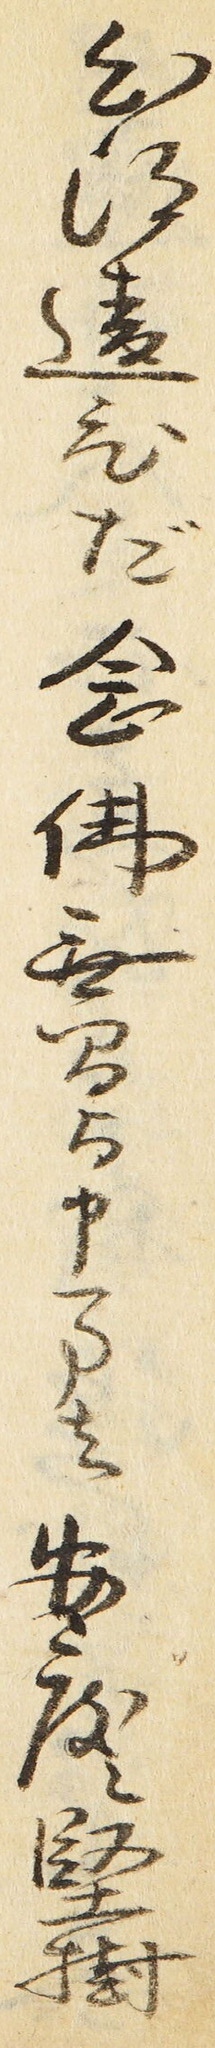心得違ひだ念佛無間と申事は安度に堅樹
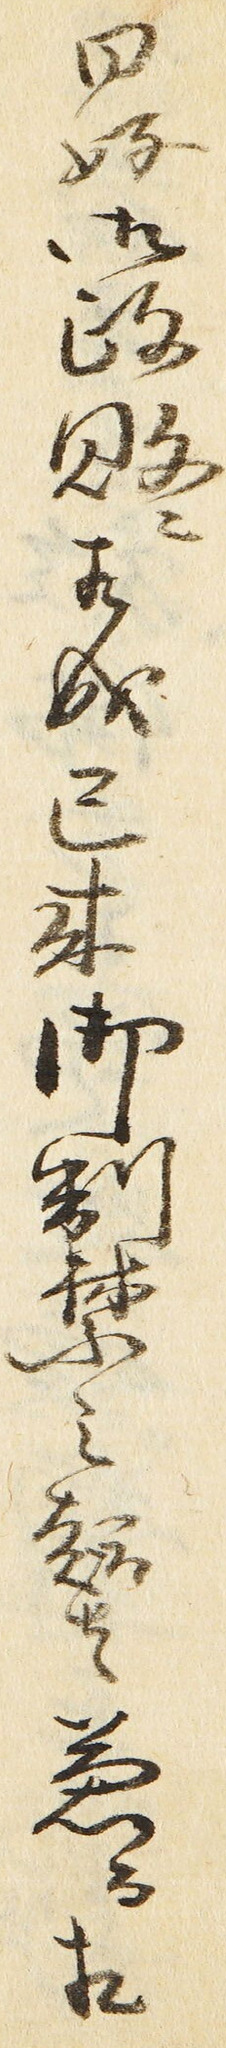日好御政敗に相成已来御制禁之趣は兼而相
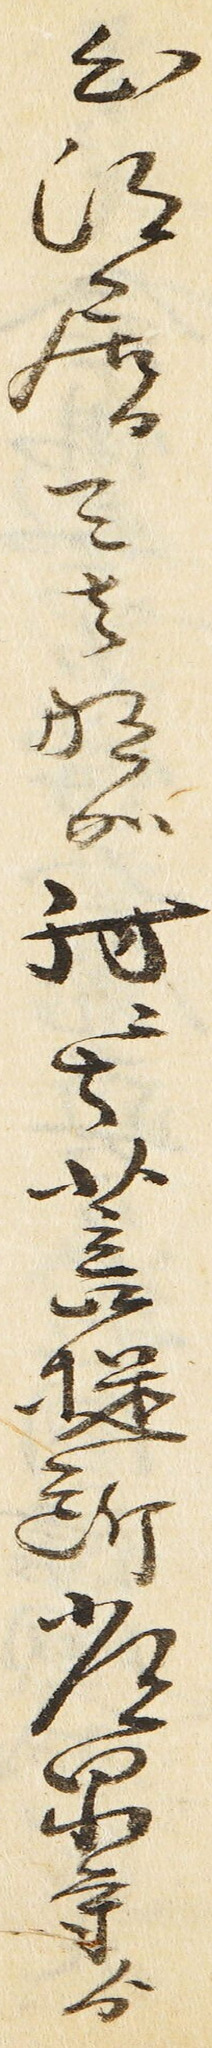心得居るてはなか殊には菩提所常泉寺ゟ
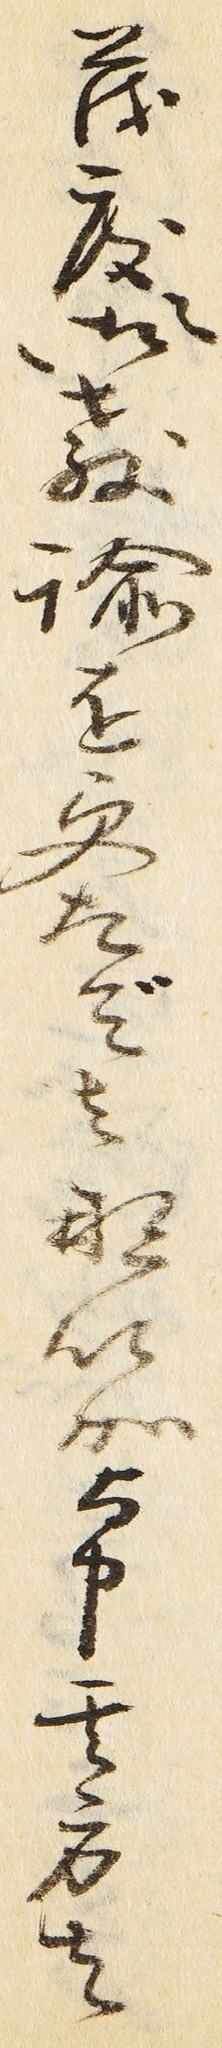も度々御教諭を受たではないかと申其方は
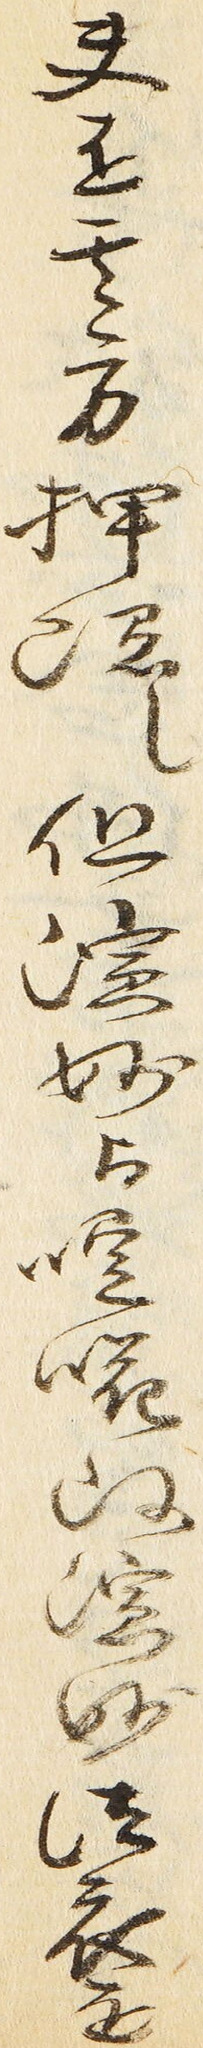夫を其方押隠し但演妙と喧嘩致演妙法衣を
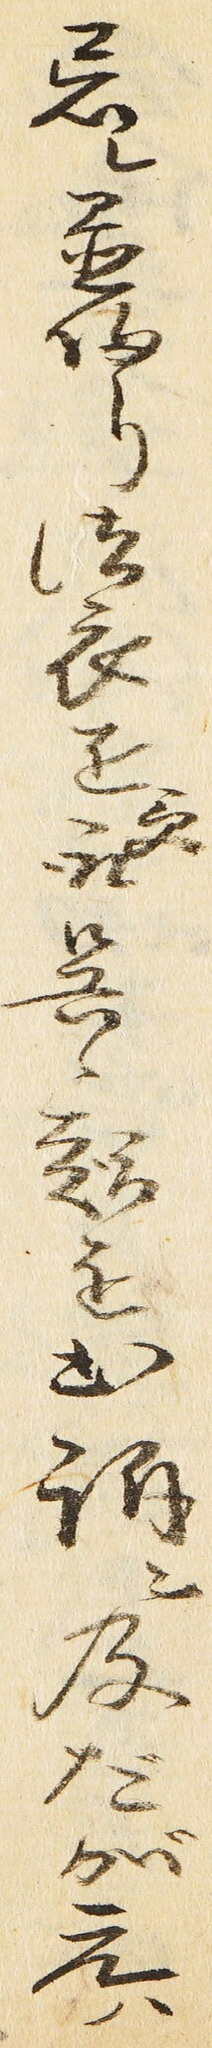忘れ置帰り法衣を受取呉候趣を出訴に及だが元は
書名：異流一件日記
